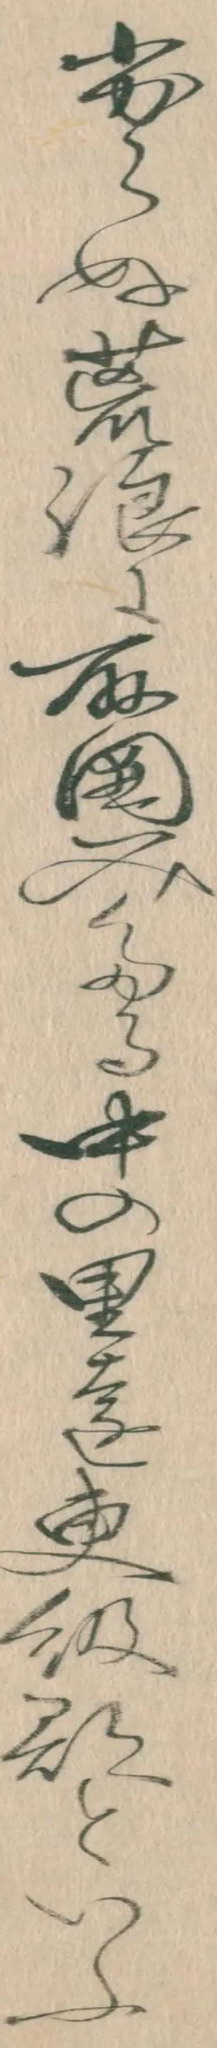劣らぬ荒浪に取囲みたる中の里を更級郡といふ
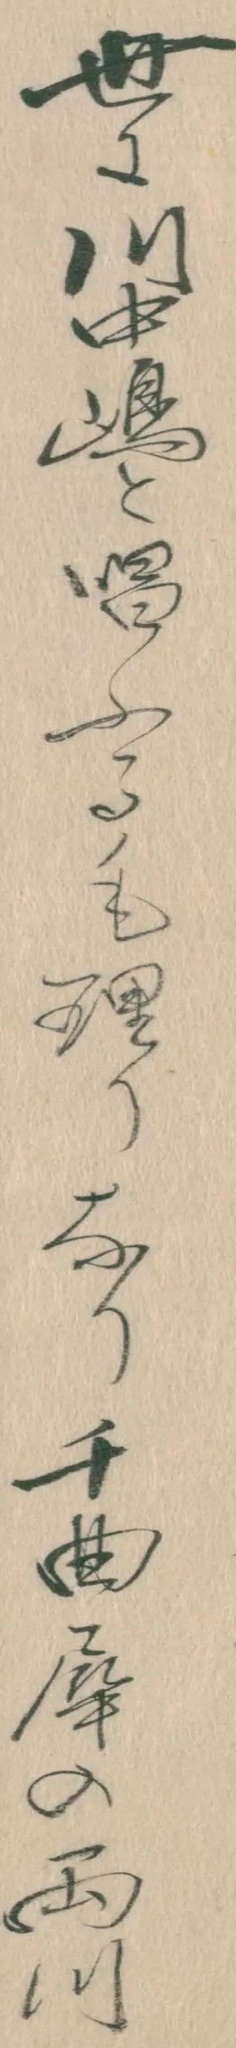世に川中嶋と唱ふるも理りなり千曲犀の両川
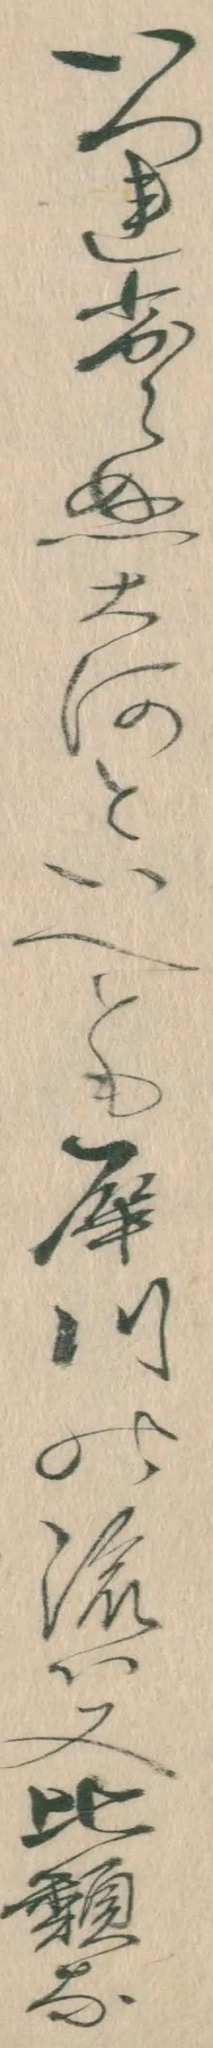いつれ劣らぬ大河といへとも犀川の流は又比類な
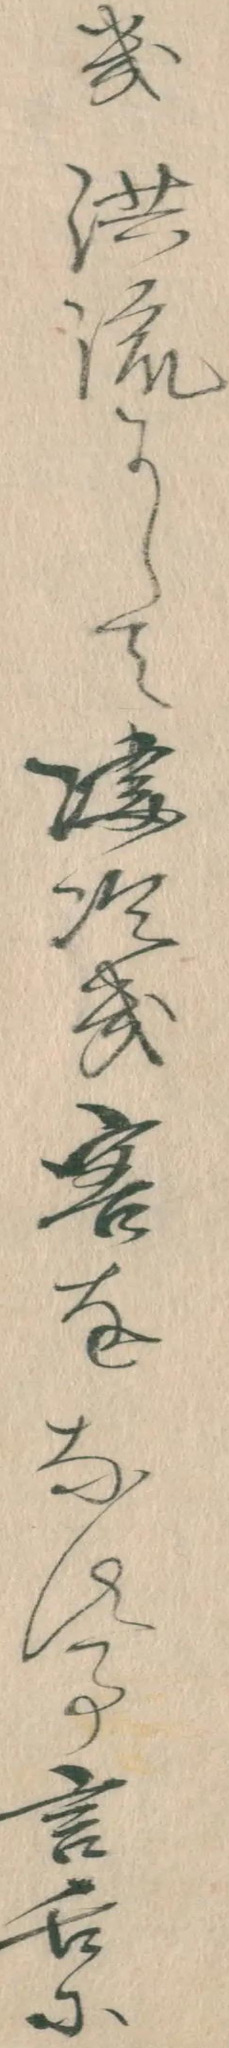き洪流にして凄じき客をなす事言舌に
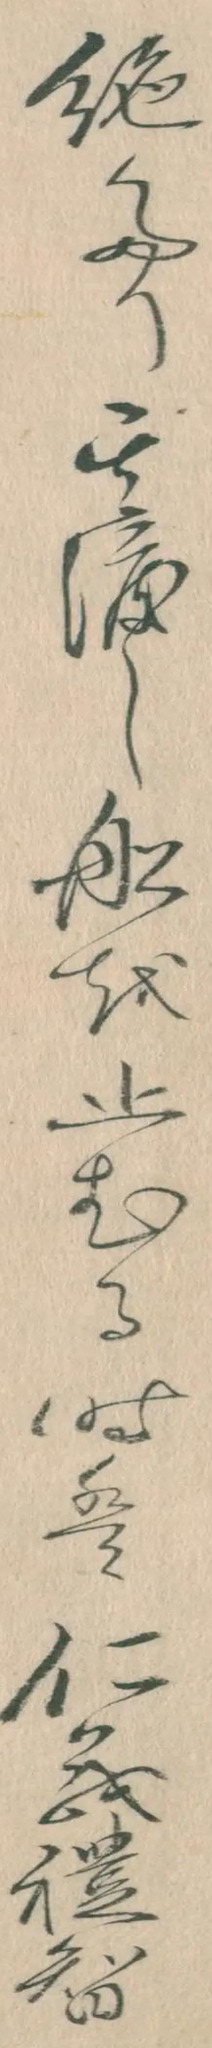絶たり其渡し船を止むる時は仁義礼智
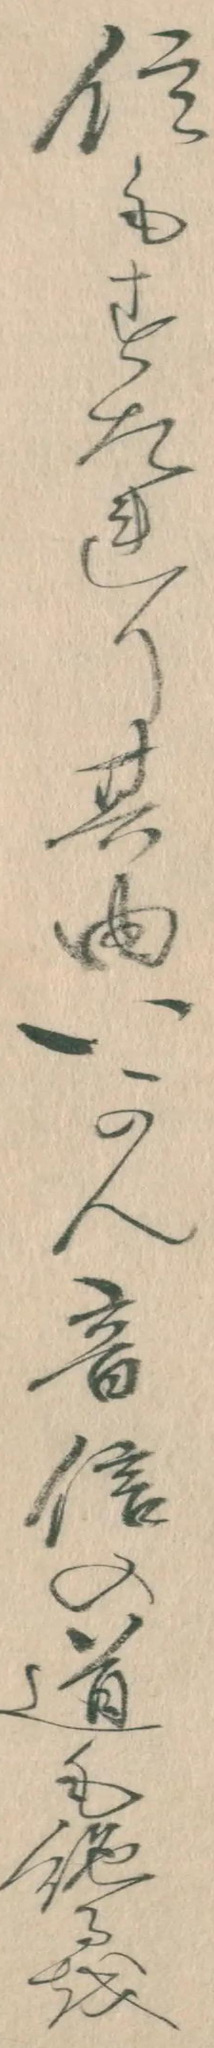信もすたれり其由いかん音信の道も絶るを
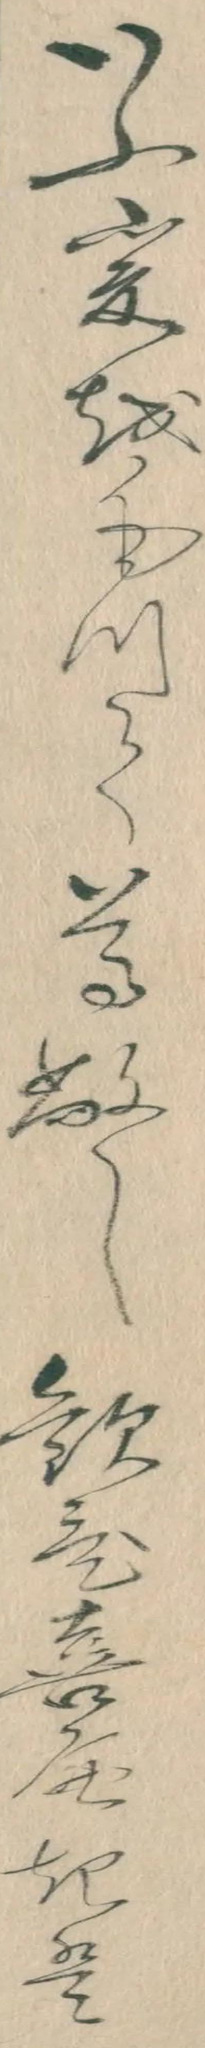いふ爰をもつて尊敬し歓ひ喜へきは

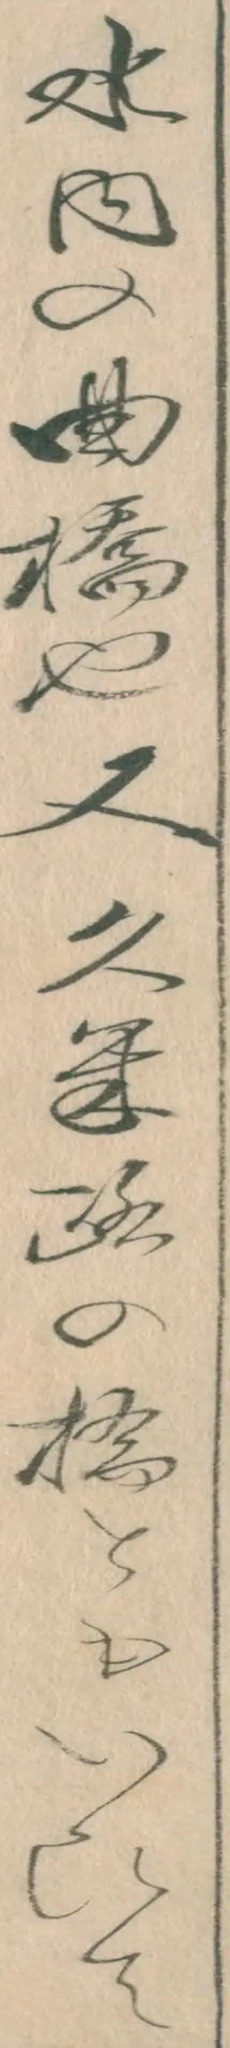水内の曲橋なり又久米路の橋ともいひて
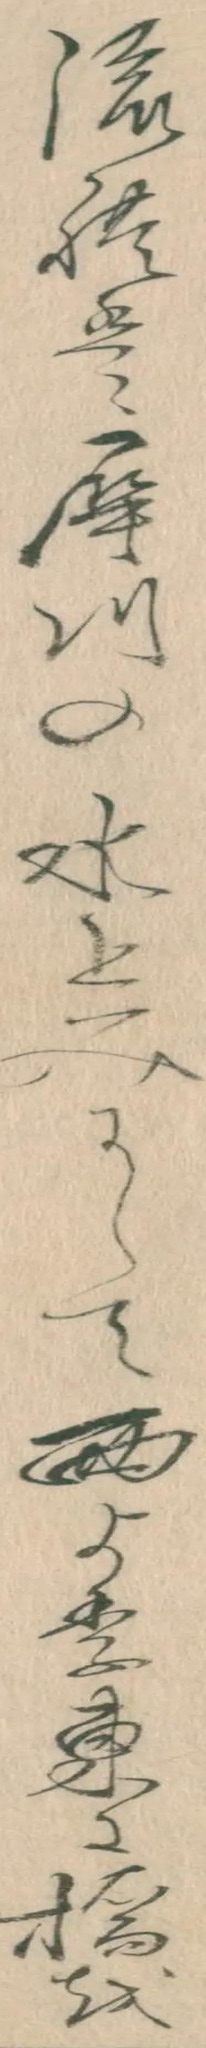流れは犀川の水上みにして西より東に橋を
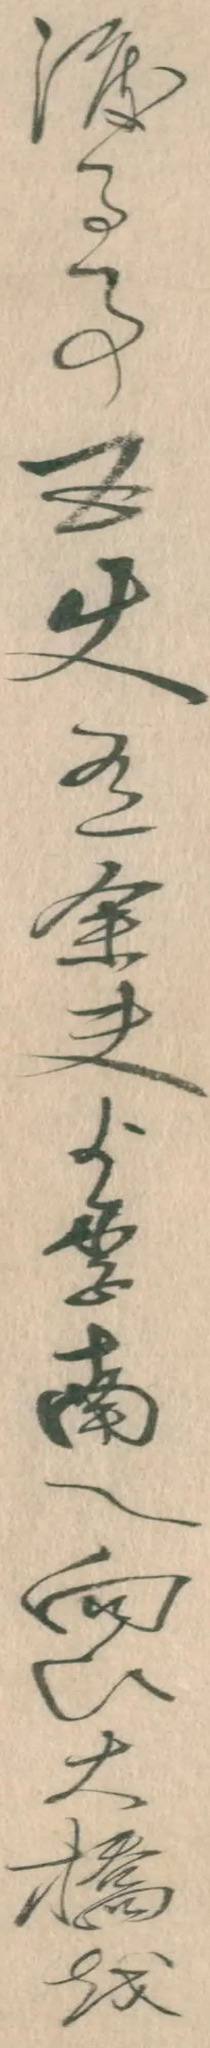渡る事五丈有余夫より南へ向ひ大橋を
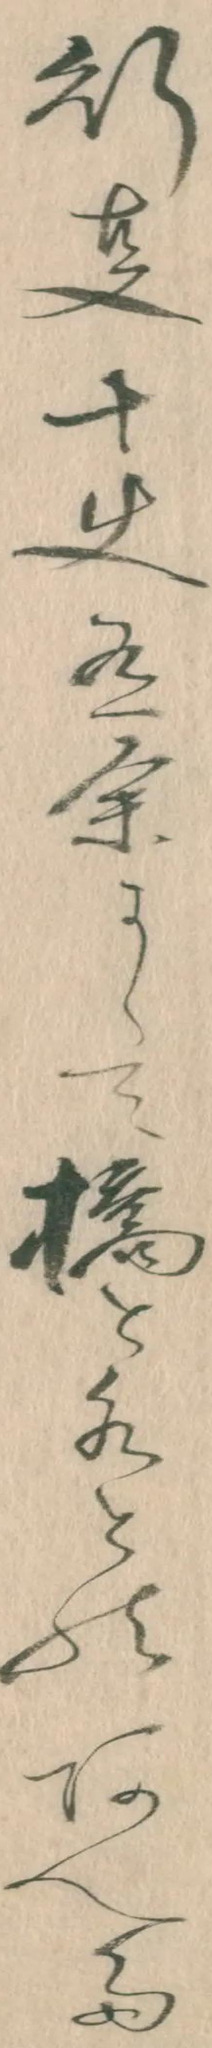行事十丈有余にして橋と水とのあへま
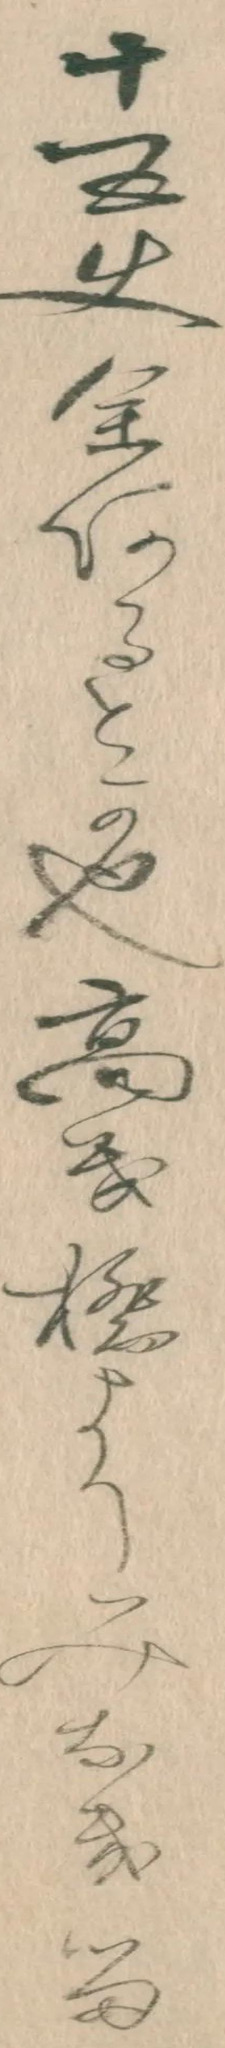十五丈余あるとかや高き橋よりみなきる
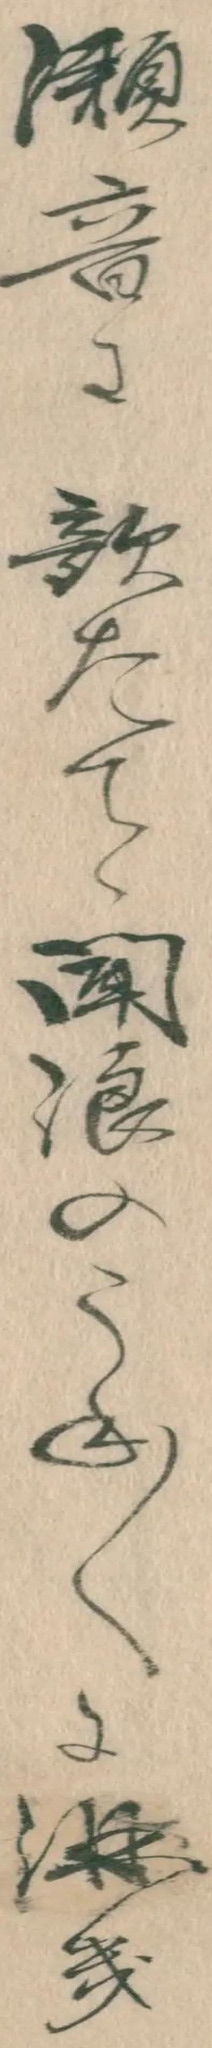瀬音にたてゝ聞浪のうね〳〵に深？き
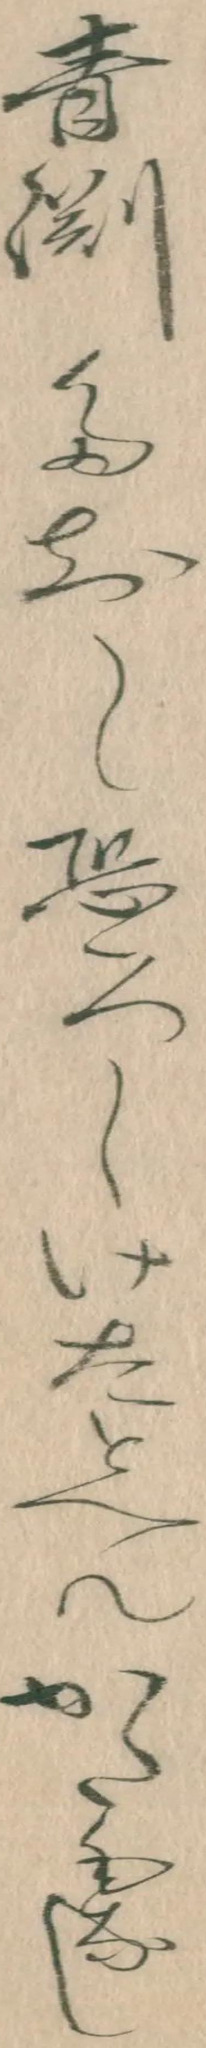青渕たちし恐ろしけたとへんかたもなし
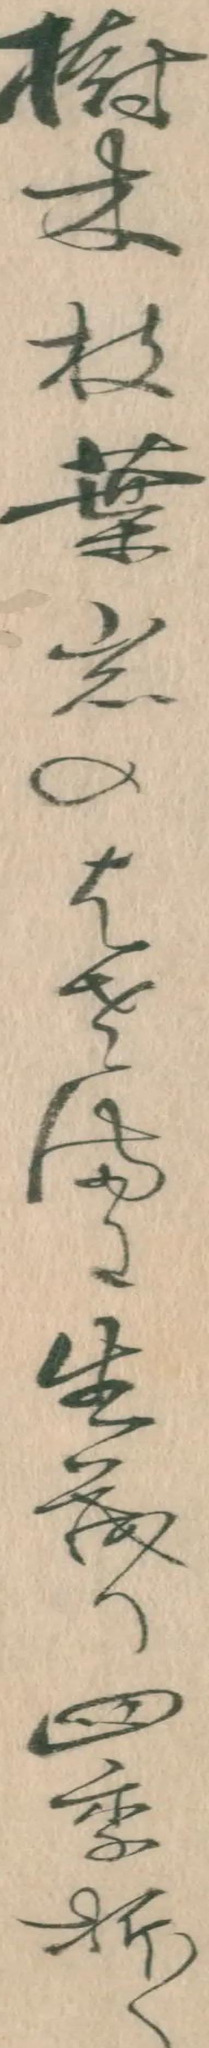樹木枝葉岩のはさまに生茂り四季折〳〵
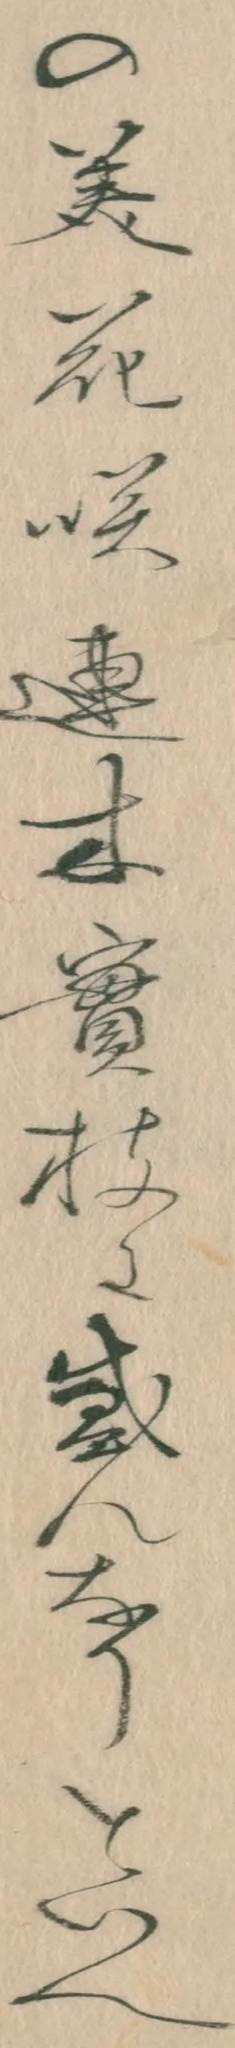の美花咲連木実枝に盛んなりといへ
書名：俗語之種. [6]
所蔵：国立国会図書館 National Diet Library, JAPAN
